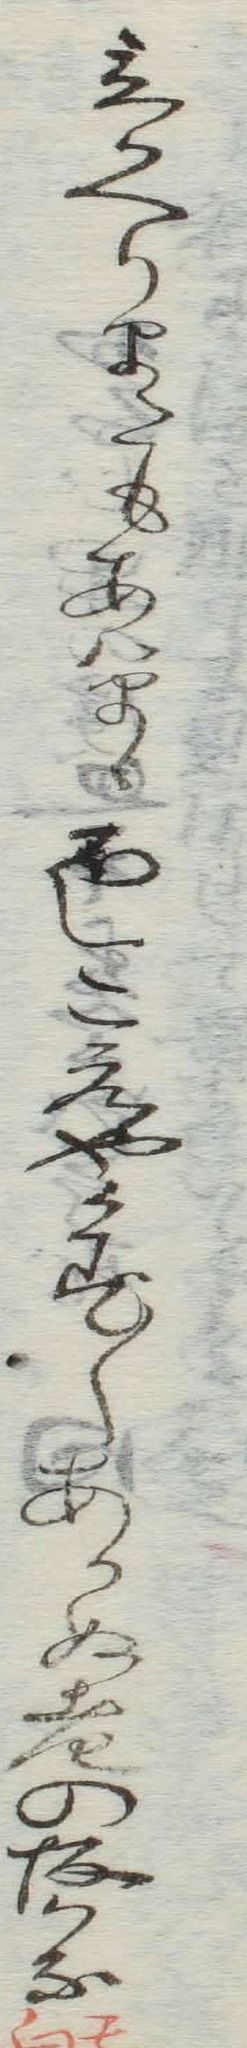立かへりまたもあはまくほしこえやかず〳〵あかぬ老の坂かなモ白
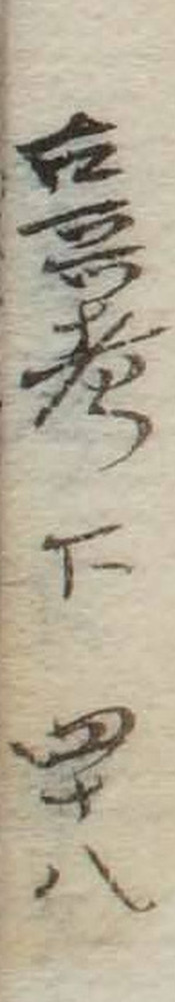古歌考下四十八

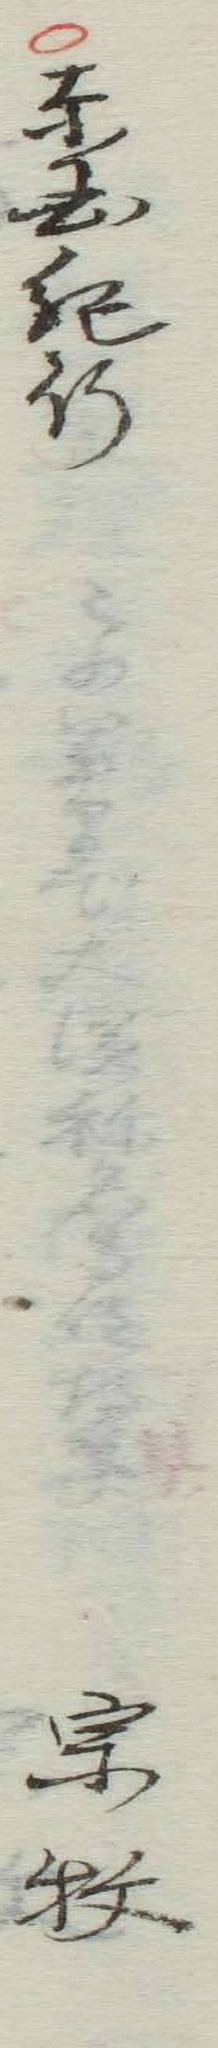○東国紀行宗牧
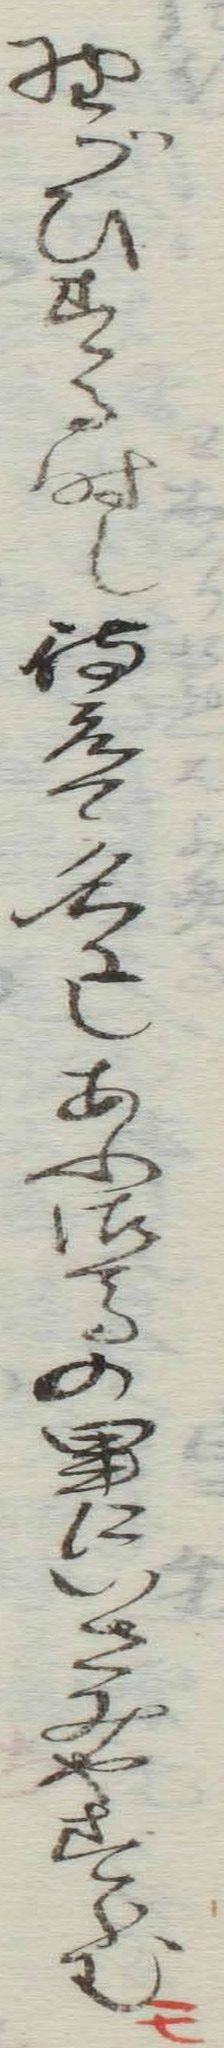野がひする時し待えて名にしあふ御馬の里にいさみやすらむモ
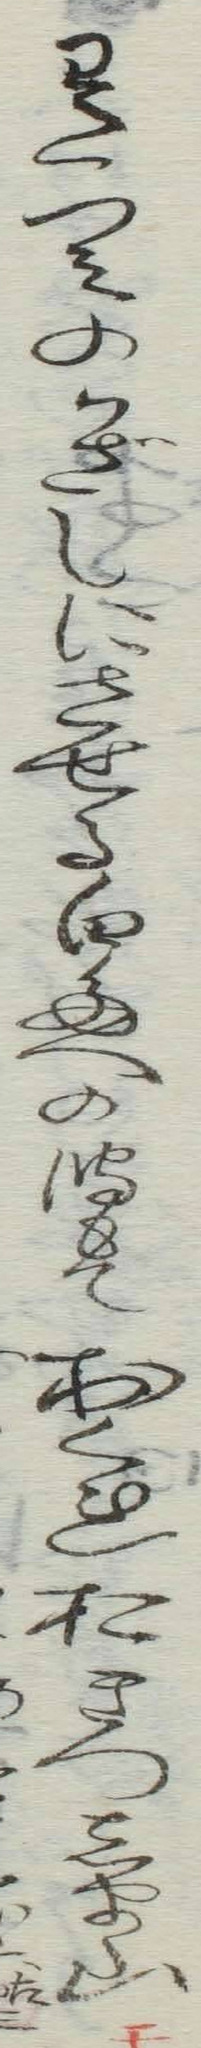わたつみのかざしにさせる白たへの波もておくれおきつしま山モ
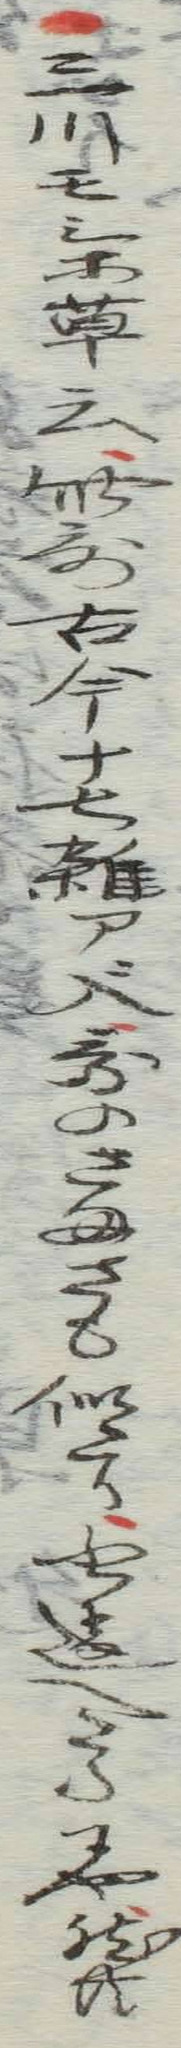●三川モシホ草云、此歌古今十七雑部ニ入、歌のさまさも似たり、書違へたるにや、然共
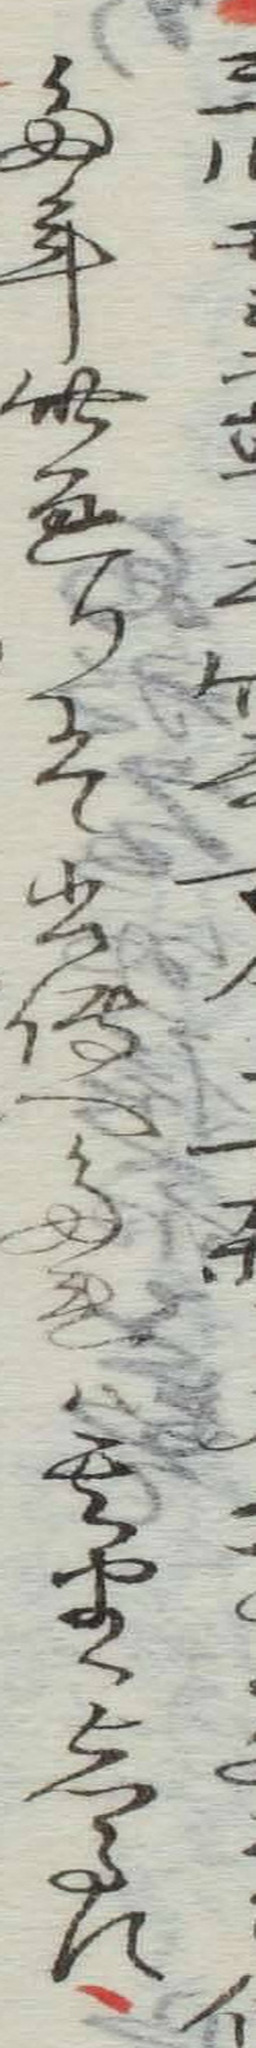多年此通りにて書伝へたれは其まゝしるす、
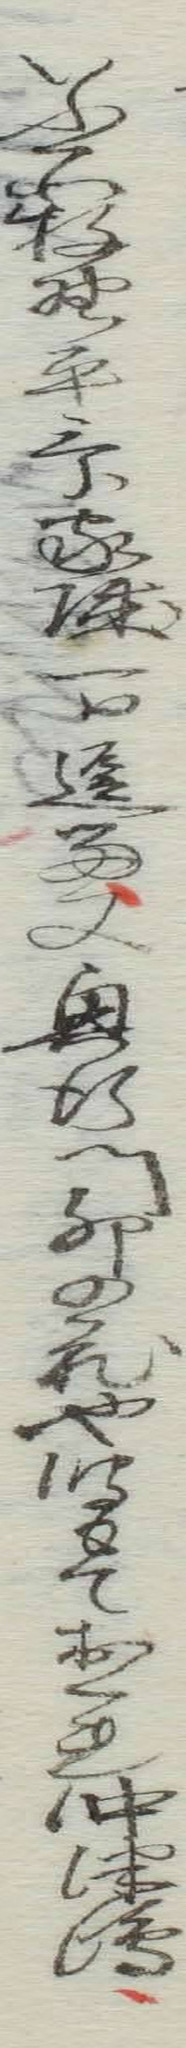いふ所牧野平三郎家城一日逗留、又興行〽卯の花や波もておくれ沖津嶋、
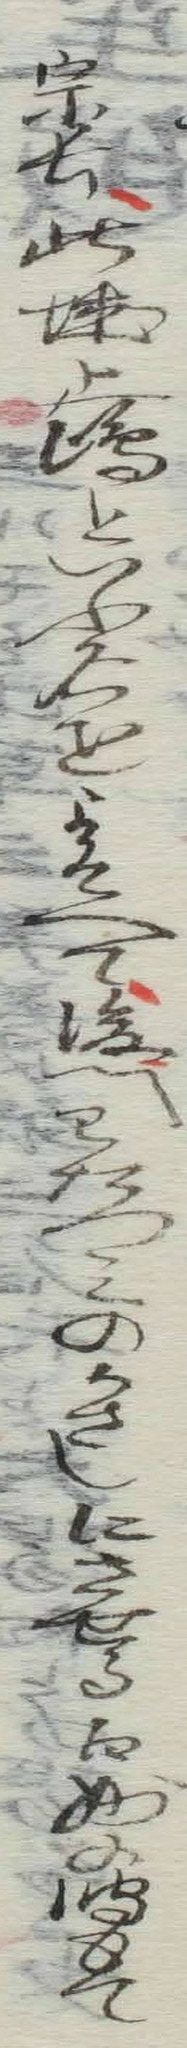宗長、此城上嶋といふ名をよそへて、後、〽わたつみのかさしにさせる白妙の波もて
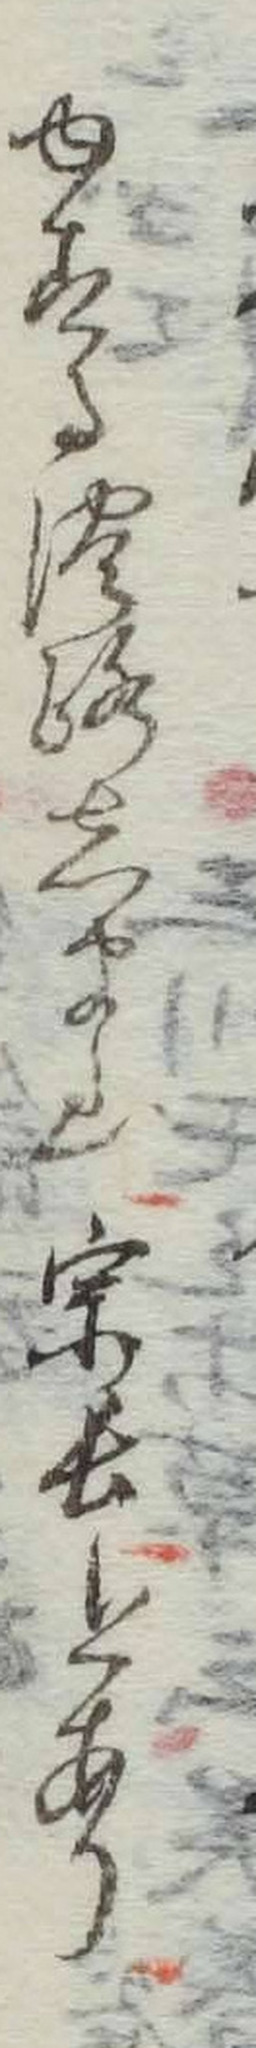ゆする淡路しま山、宗長、とあり、
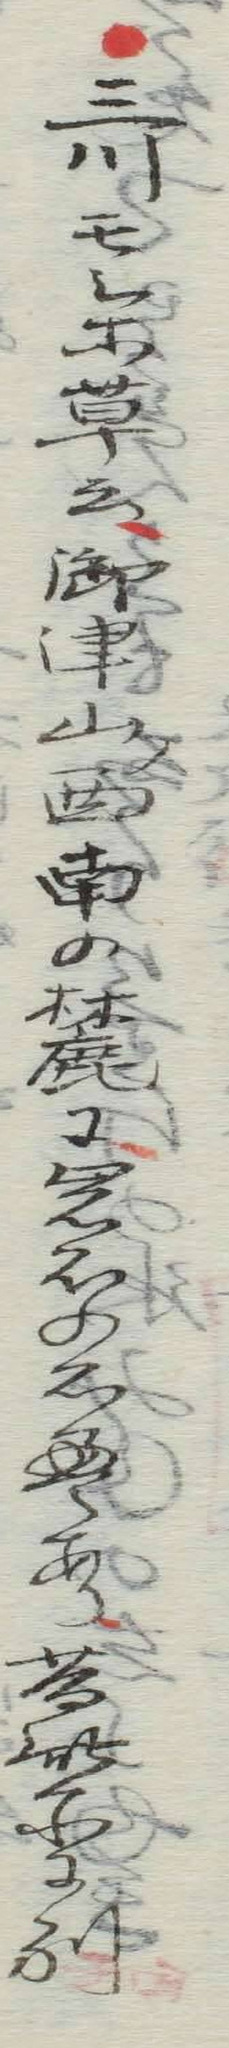●三川モシホ草云、御津山西南の麓に、岩ほの石畳あり、昔此所に別
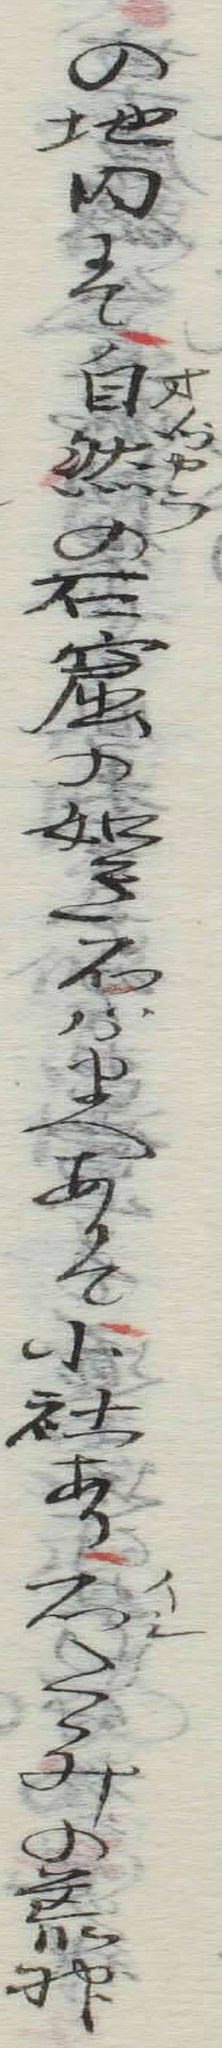の地内にて、自然の石窟の如き石がまへありて、小社あり、石たゝみの荒神
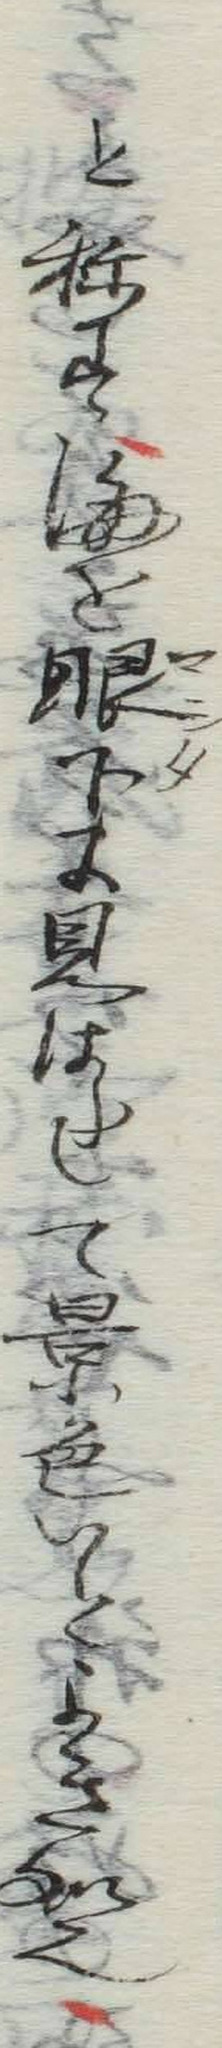と称す、海を眼下に見はらして景色いとよき処也、
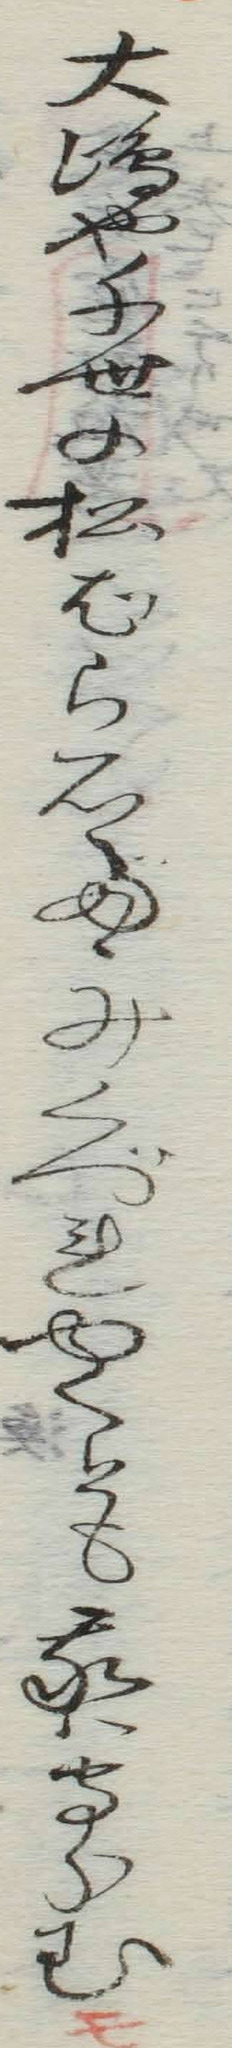大嶋や千世の松ばら石だゝみくづれゆくとも我は守らむモ
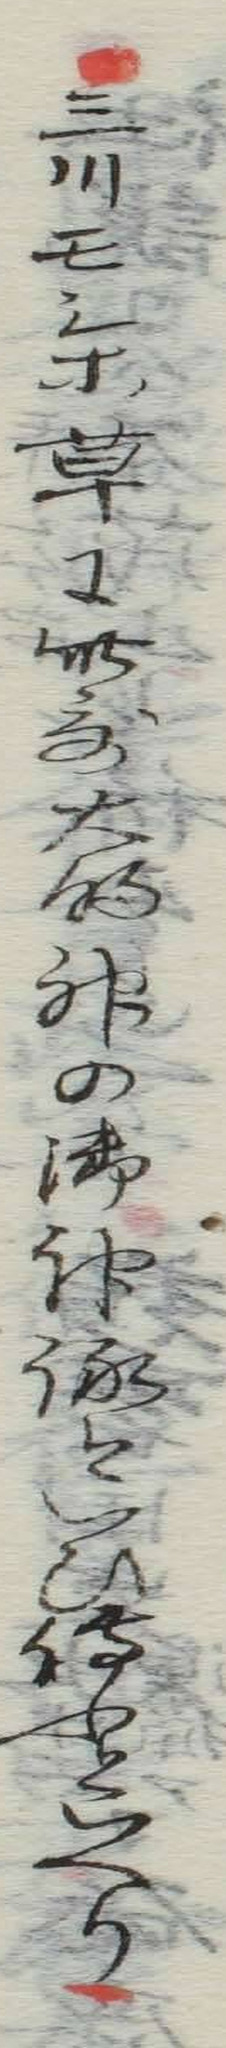●三川モシホ草に此歌大明神の御神詠といひ伝ふといへり、
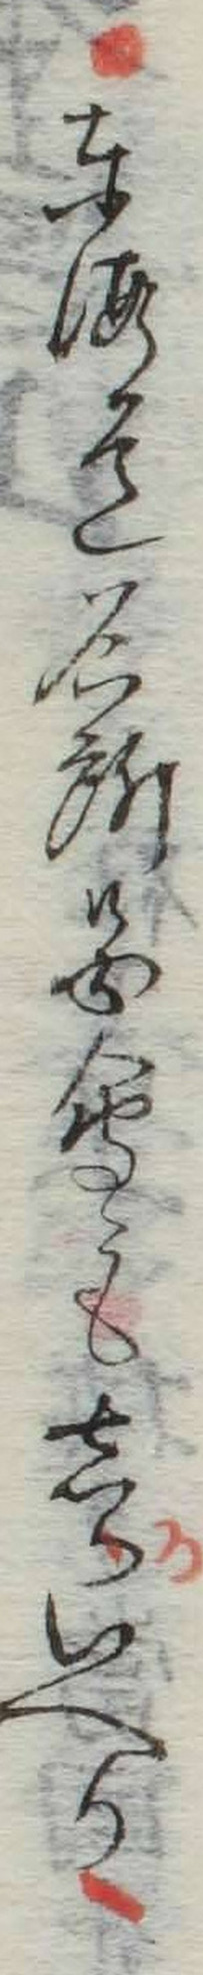●東海道名所図会にもしかいへり、
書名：三河国古跡考
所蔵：国文学研究資料館
